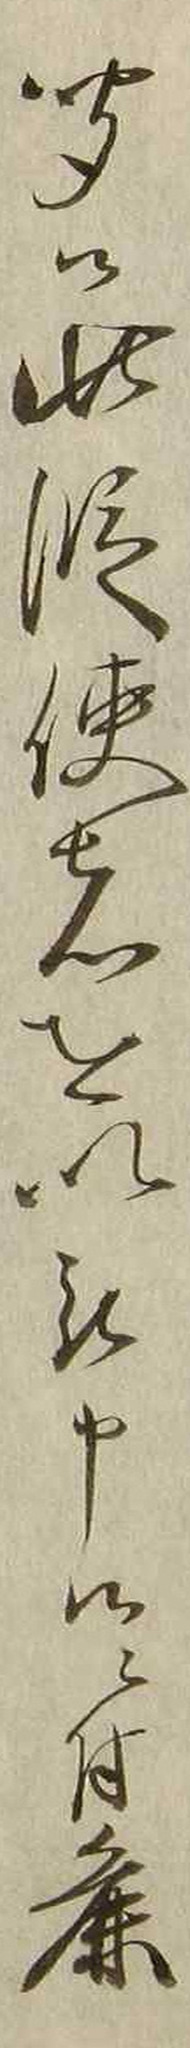聞候此段使者を以被申に付麁
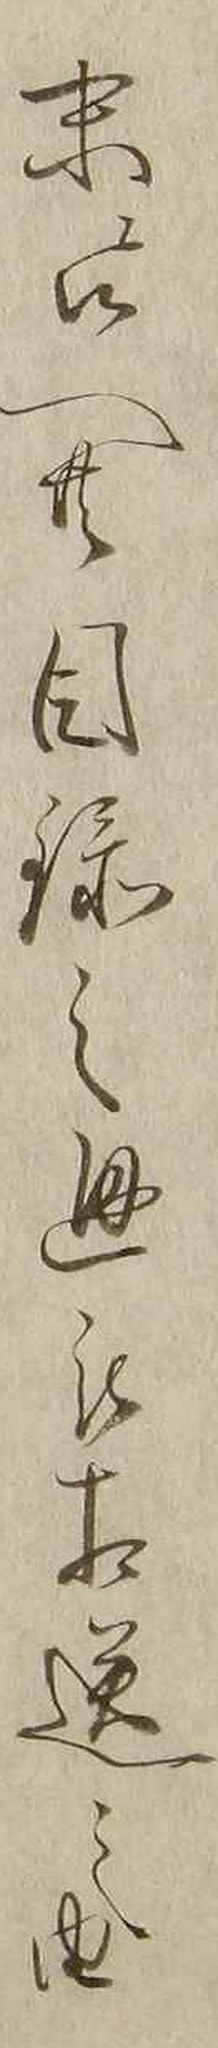末に候へ共目録之通被相送之由
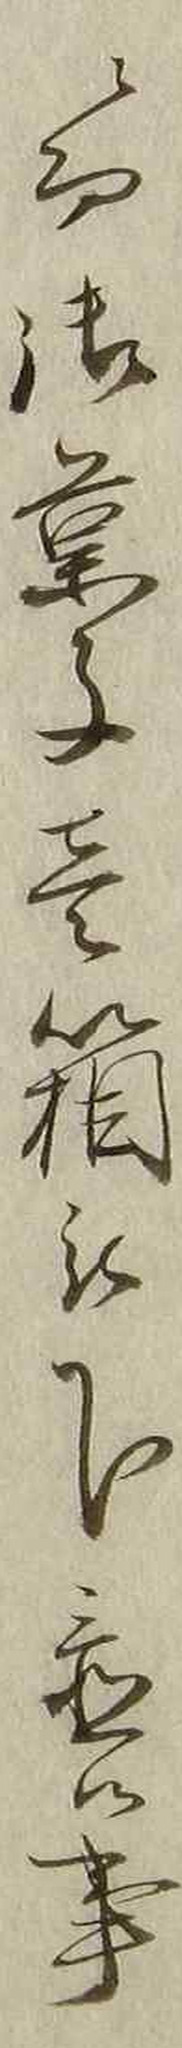候而御菓子壱箱被下置候事
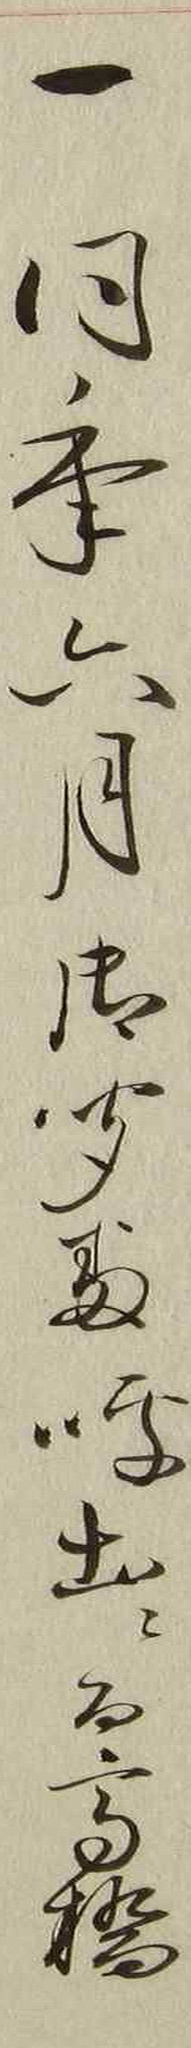一同年六月御聞番呼出に而高橋
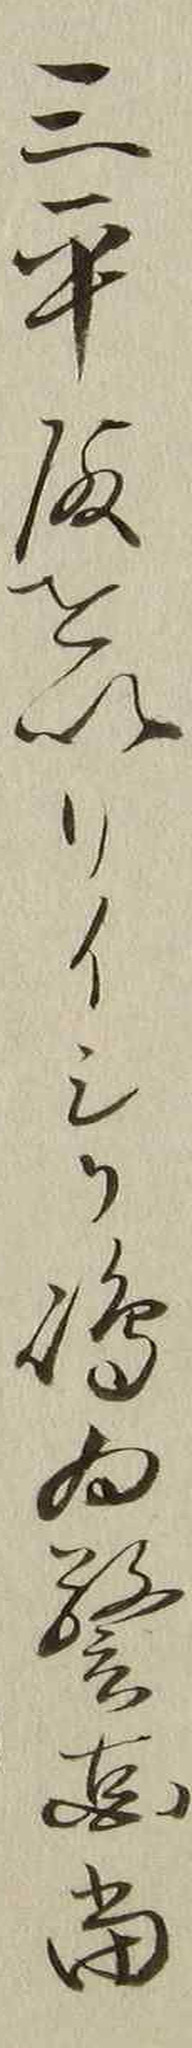三平殿を以リイシリ嶋為警固当
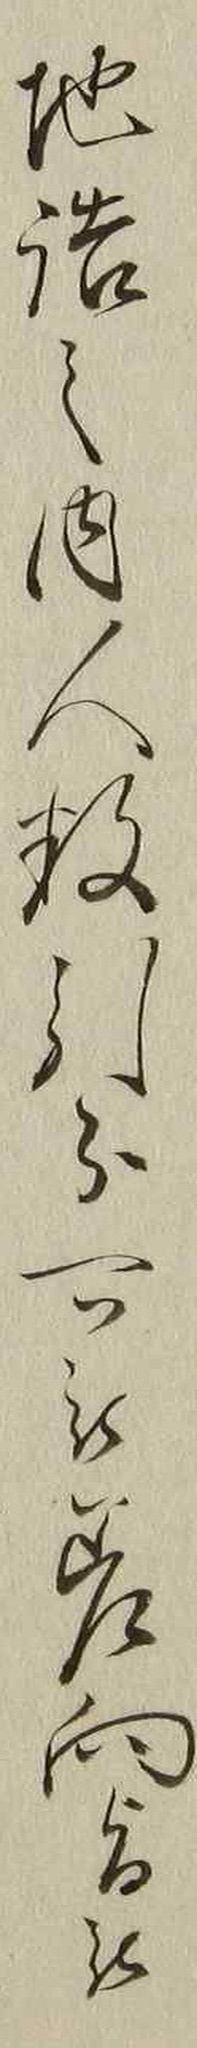地詰之内人数引分可被差向旨被
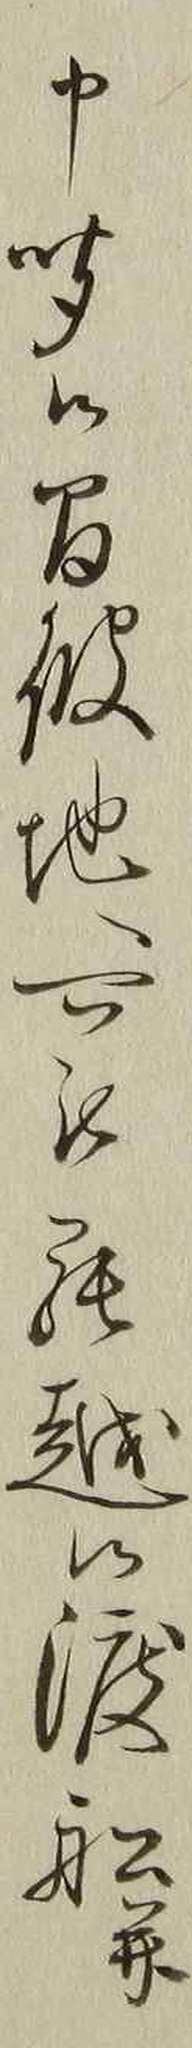申聞候間彼地へ可被罷越候渡船并
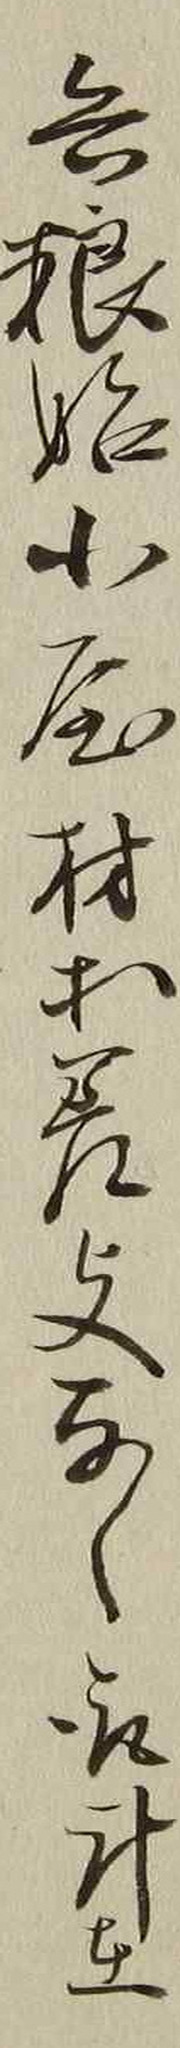兵粮始小屋材等差支なく取計在
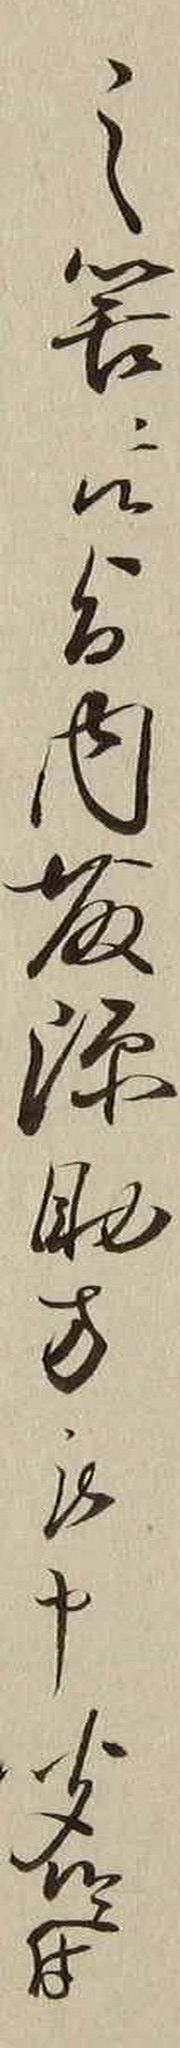之筈に候旨内藤源助方被申聞候に付
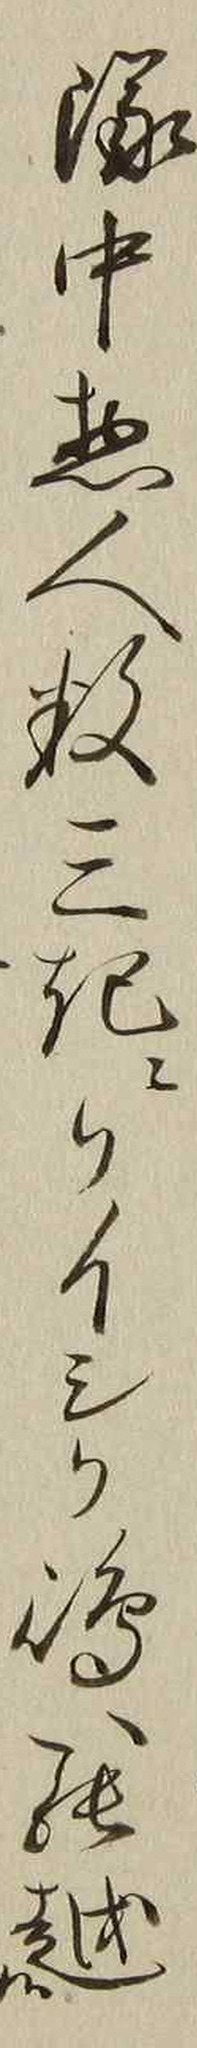隊中惣人数三起にリイシリ嶋へ罷越
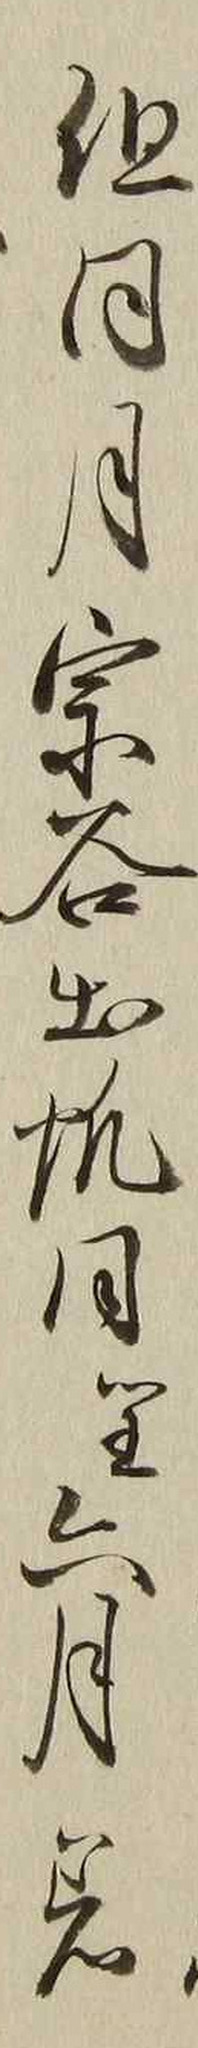但同月宗谷出帆同閏六月着
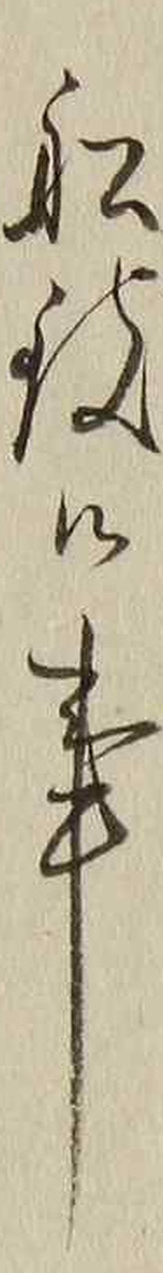船致候事
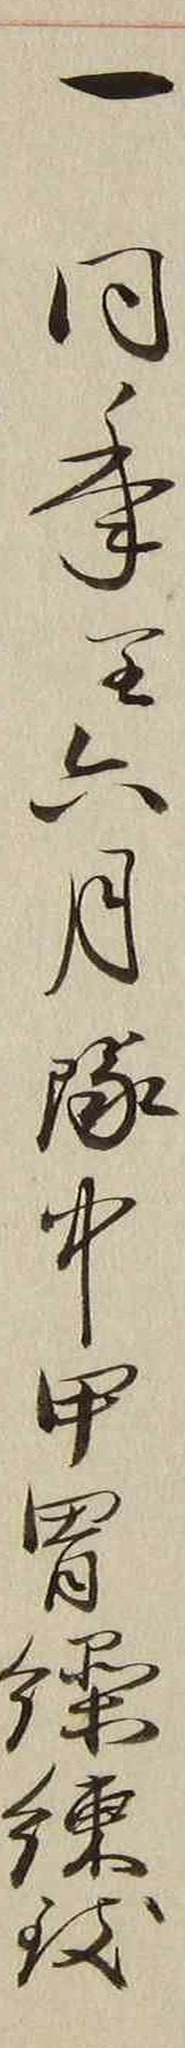一同年閏六月隊中甲冑繰錬致
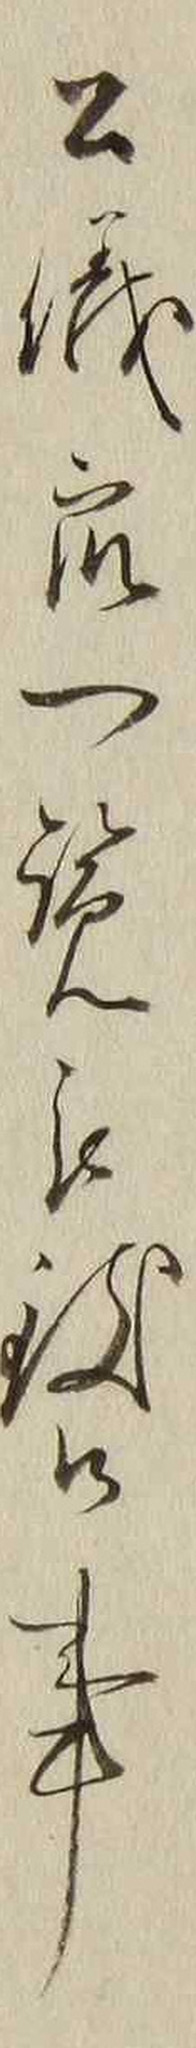公儀衆一覧被致候事
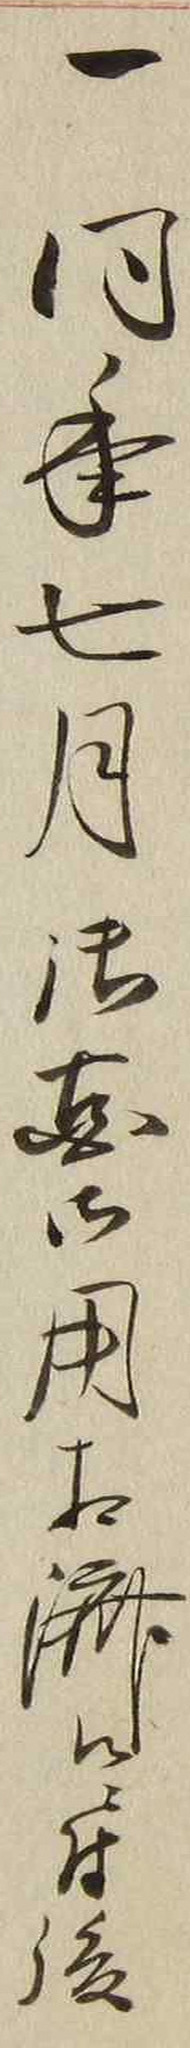一同年七月御固御用相済候に付後
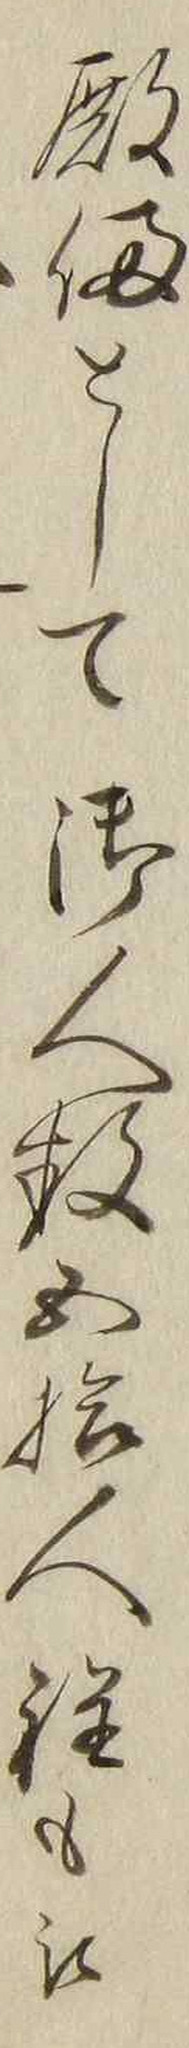殿備として御人数五拾人程も被
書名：諸士系譜　巻之103　か之部11
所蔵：会津若松市立会津図書館
